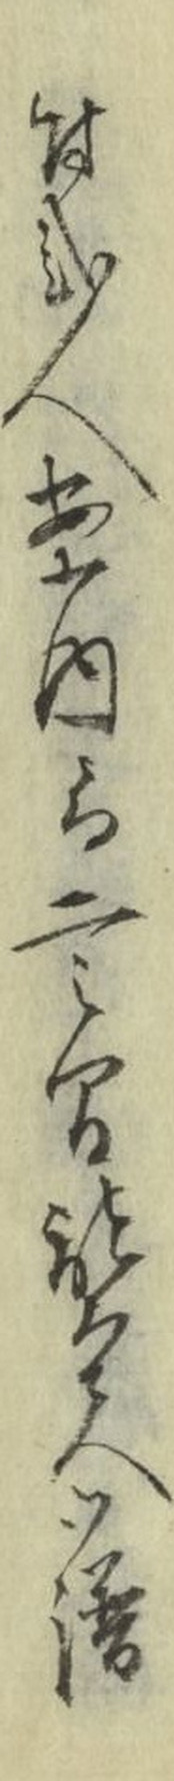付弐人案内に而二之間諸大夫御譜
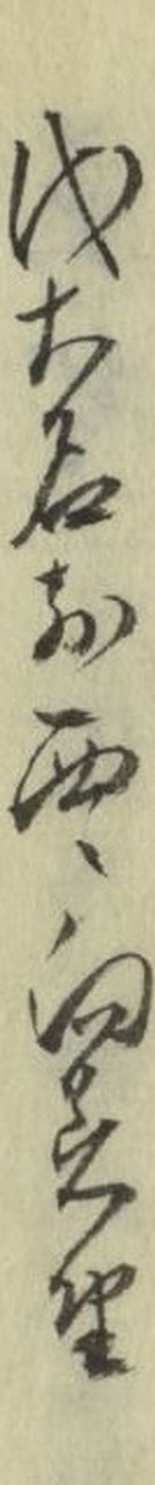代大名前西へ向着坐
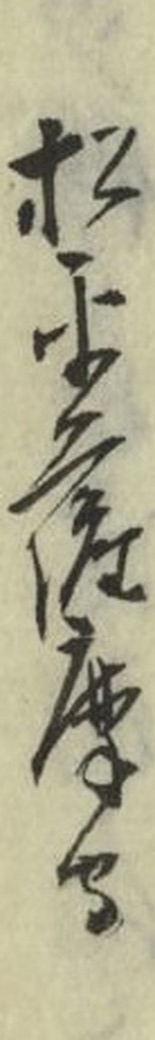松平薩摩守
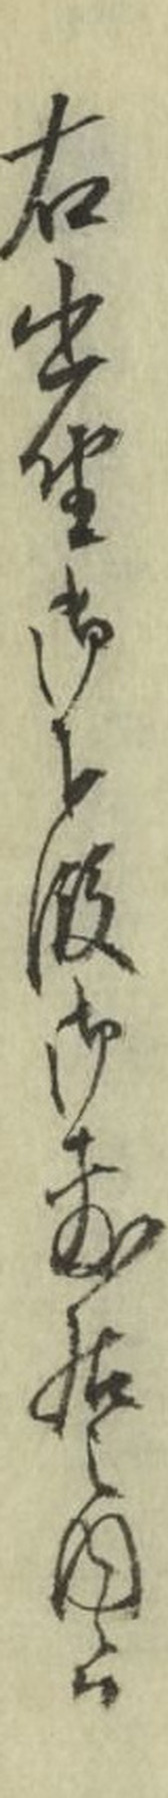右出坐御下段御敷居之内に而
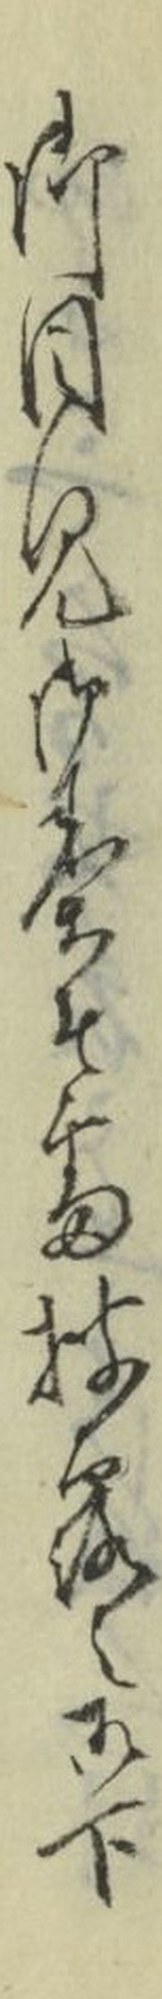御目見御奏者番披露之御下
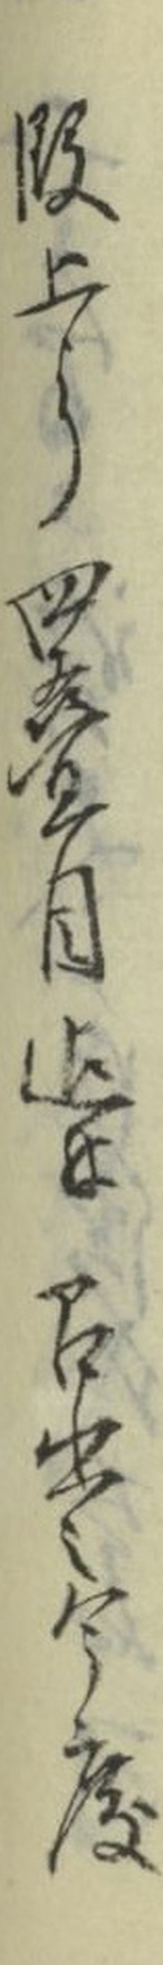段上より四畳目迄被召出之今度
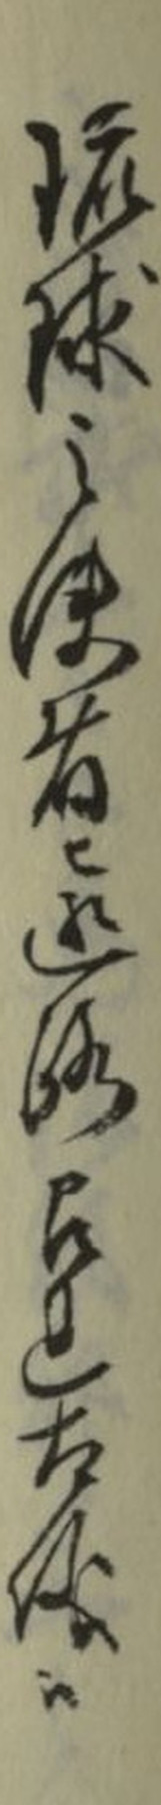琉球之使者遠路召連太義被
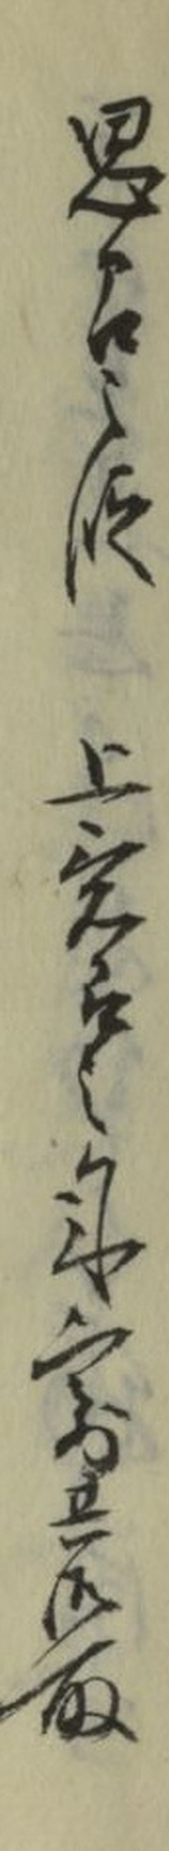思召之段上意有之年寄共御取
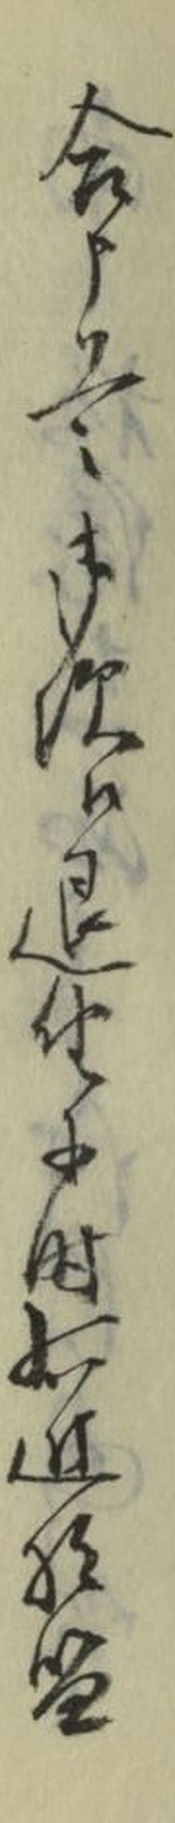合申上之御次え退坐于時右近将監
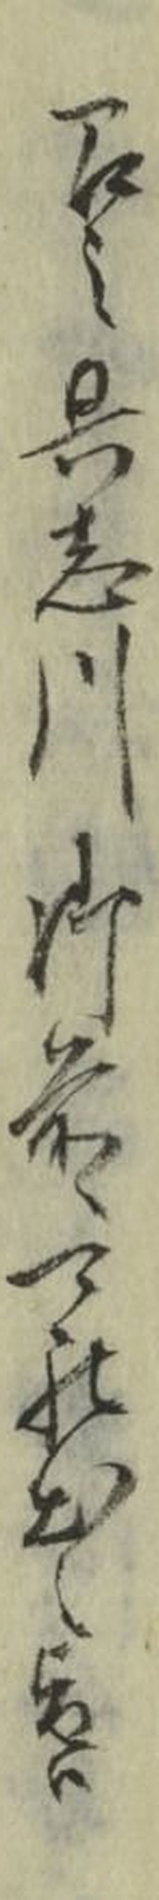召之具志川御前へ可罷出之旨被
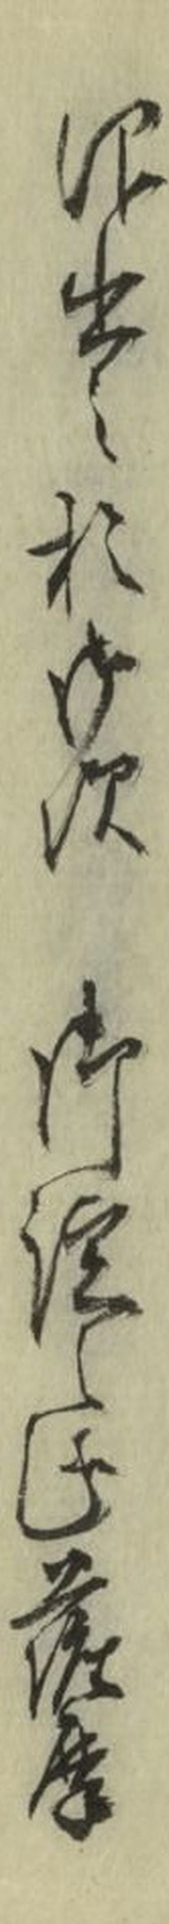仰出之於御次御諚之趣薩摩
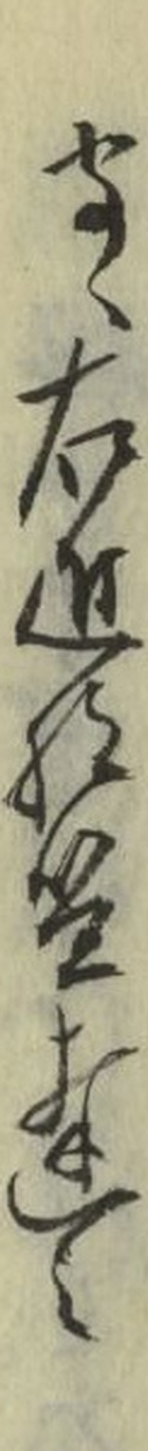守へ右近将監達之

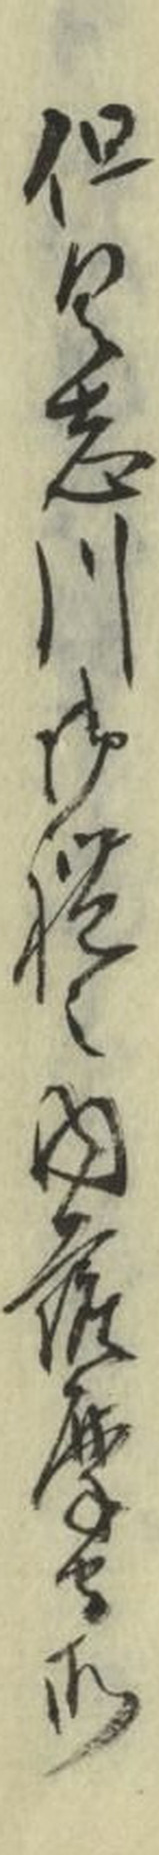但具志川御礼之内薩摩守御
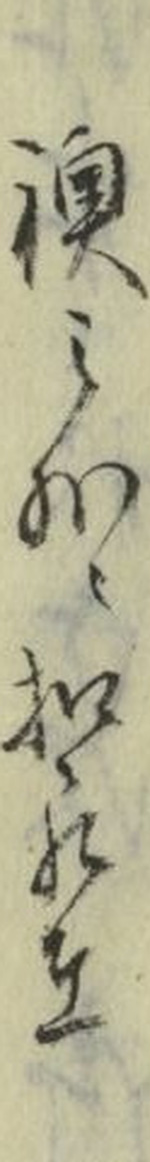襖之外に控罷在
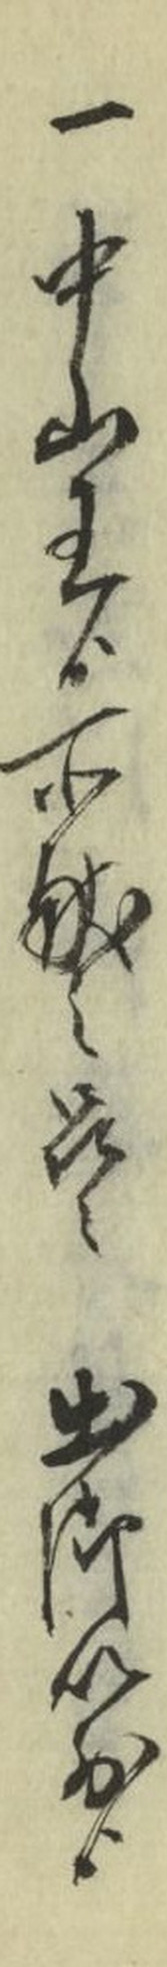一中山王ゟ所献之品々出御以前ゟ
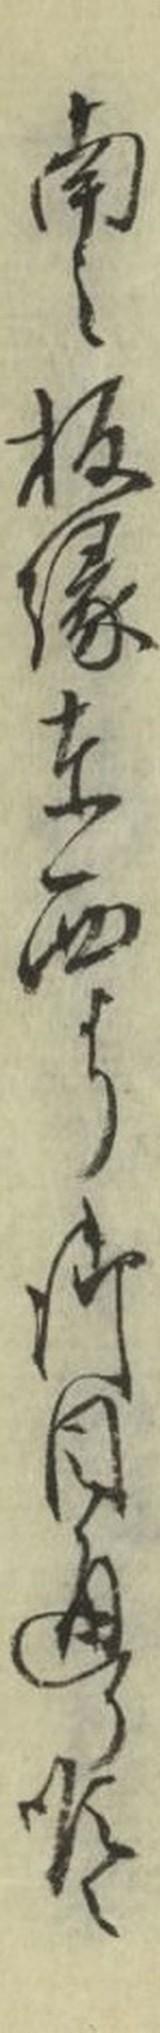南之板縁東西より御目通り順々
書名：琉球人来朝記 三
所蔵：University of the Ryukyus Library
